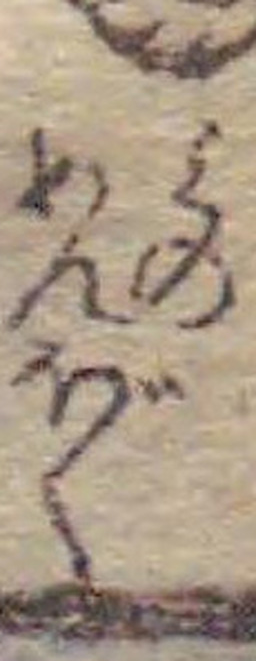めんぼく
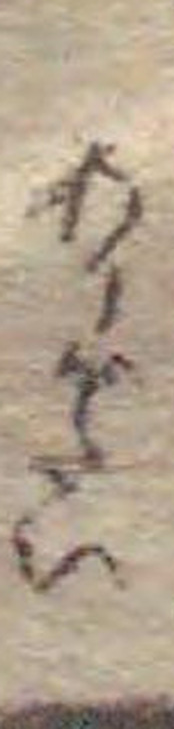ありがたい
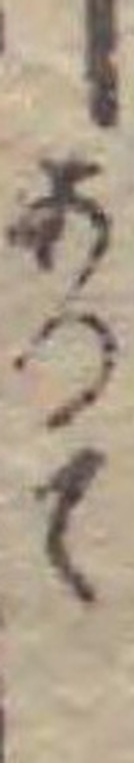あつて
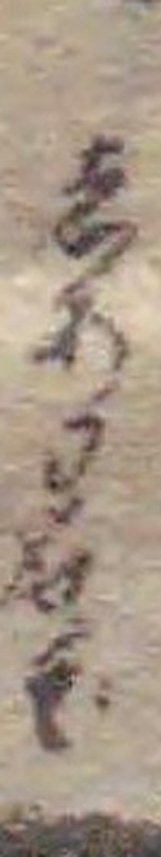しあわせで
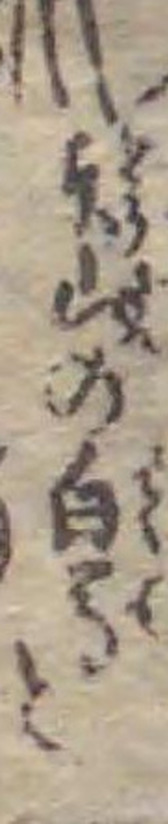東山の白馬と
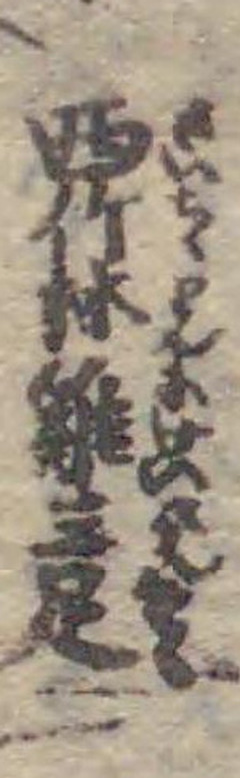西竹林鶏三足
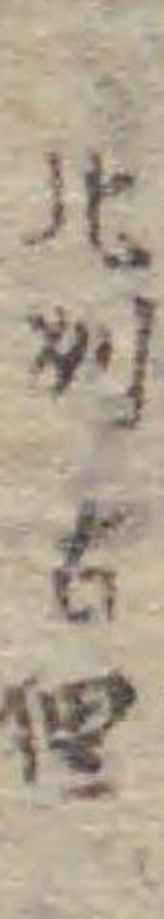北州古狸
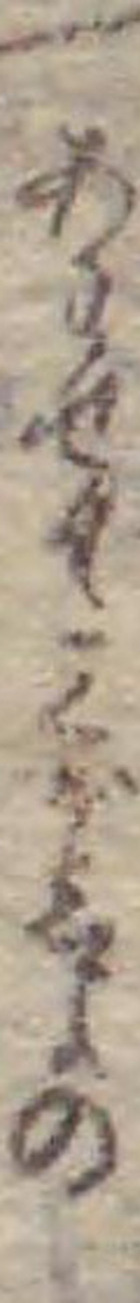あわせて三がしよの
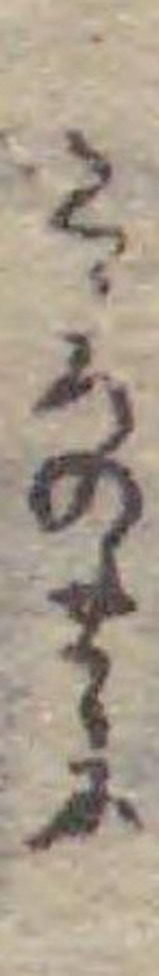こゝろのまゝに
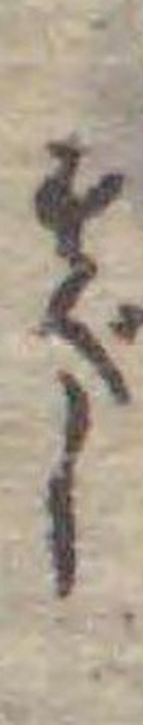すべし

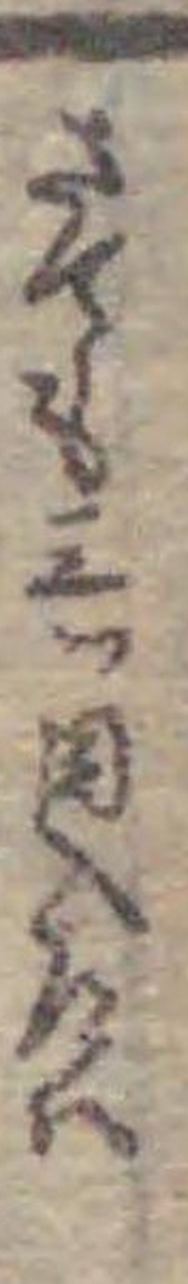さても三つ目入道は
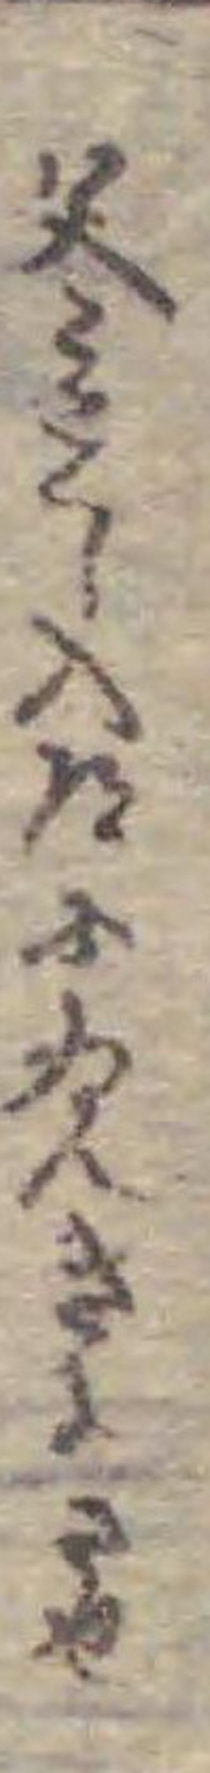父みこし入道にゐんきよさせ
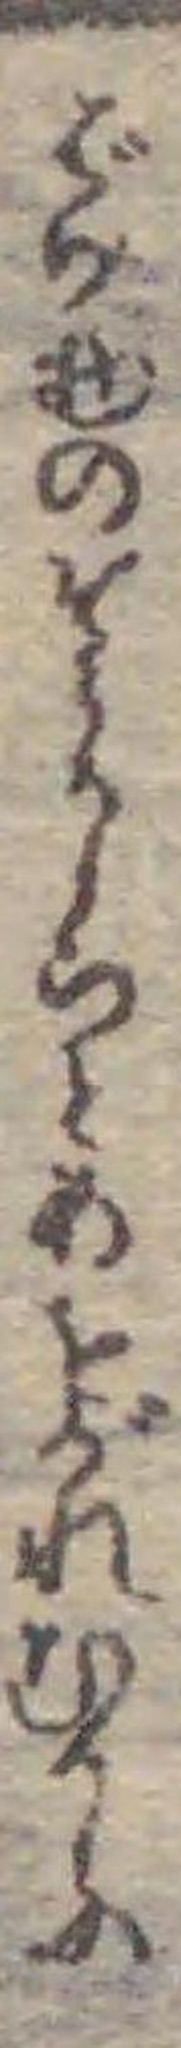ばけ物のそうかしらとあをがれむかふ
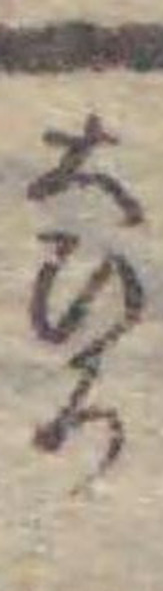大ひろ
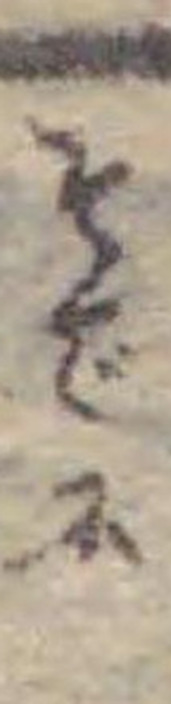そでに
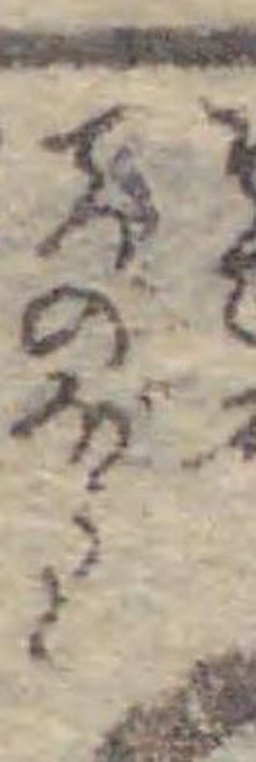てつのぼうと
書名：[化物一代記] : 5巻
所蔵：国立国会図書館 National Diet Library, JAPAN
